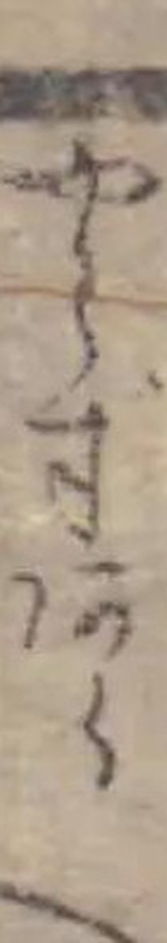やらずあら
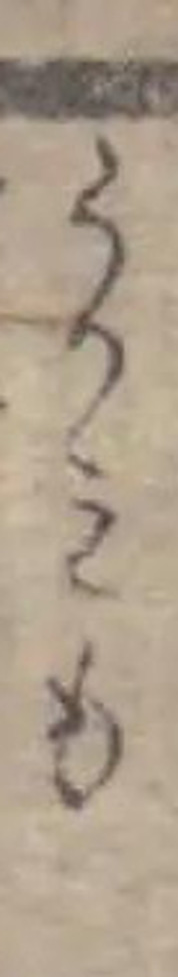うかみも
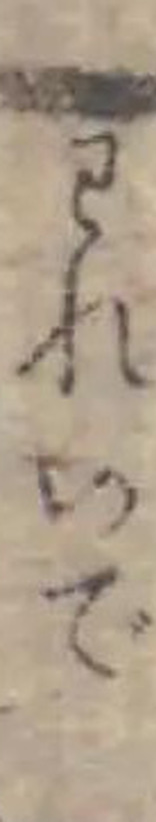われいで
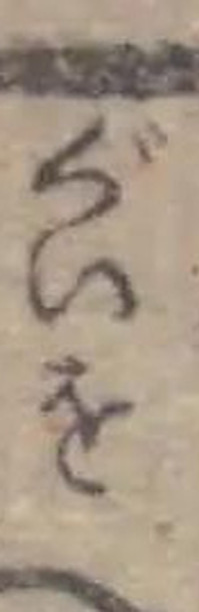ぐいを
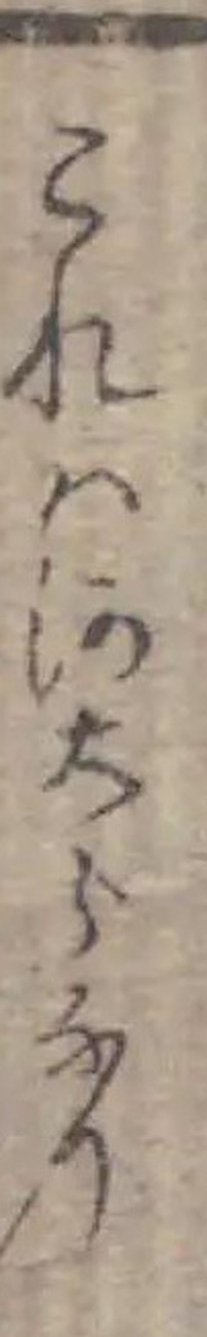これは河太郎なり
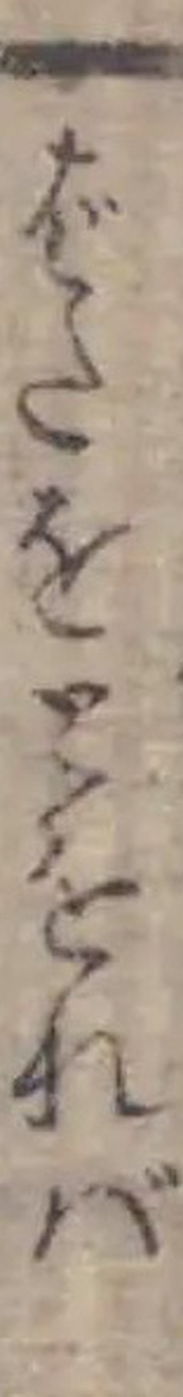ばたをとをれば
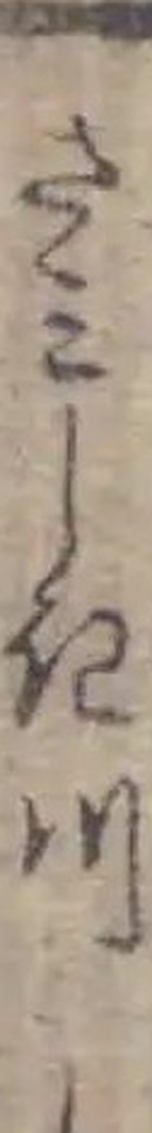さみしき川
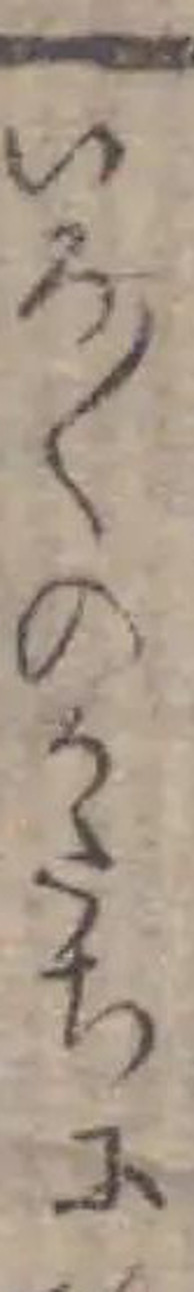いろ〳〵のかたちに
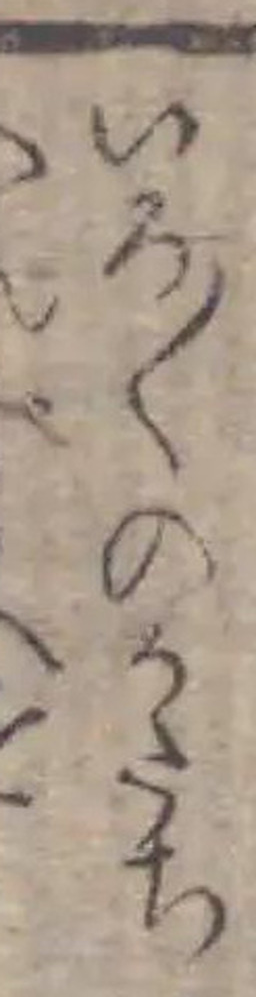いろ〳〵のかたちに
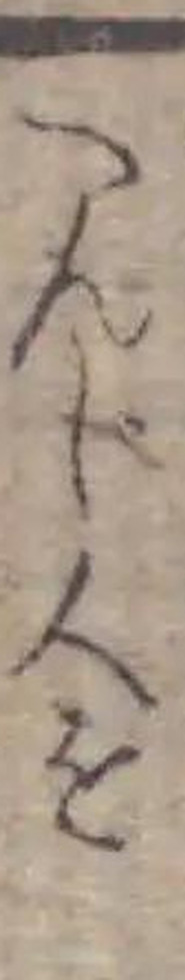へんじ人を
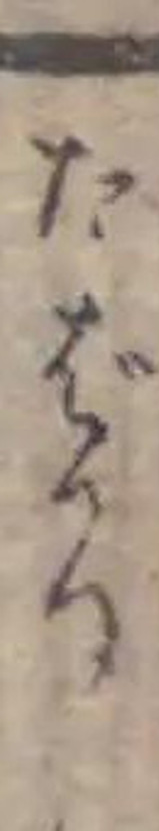たばかり
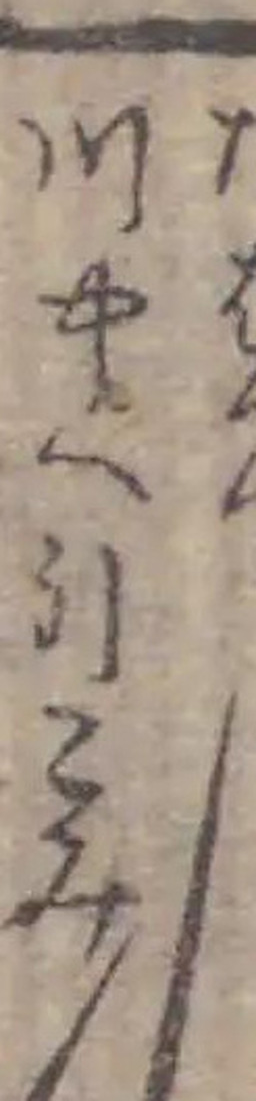川中へ引こみ
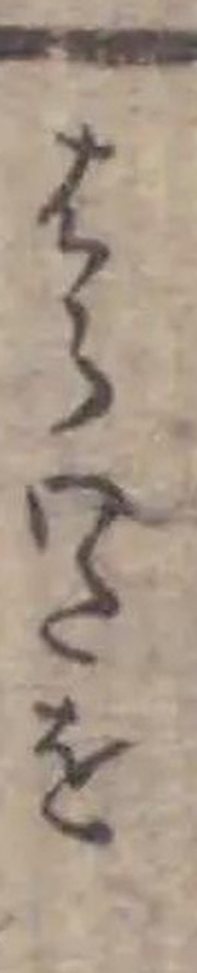はらわたを
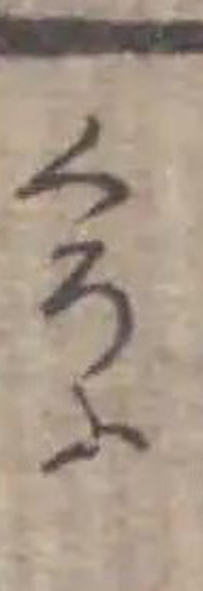くろふ

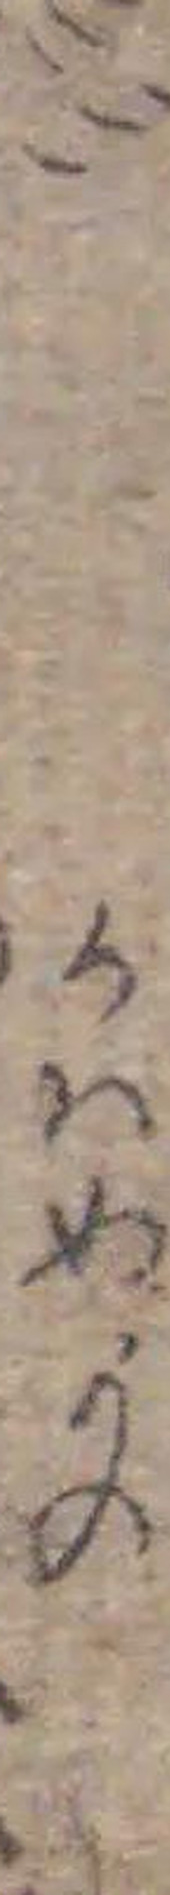かはぬもの
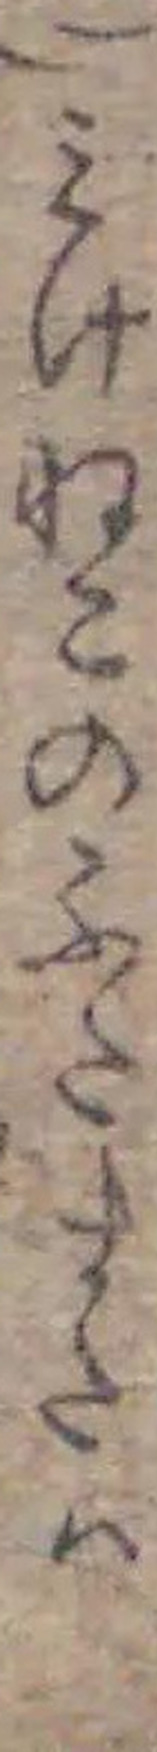みけねこのふたまたは
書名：夭怪着到牒 2巻
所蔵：国立国会図書館 National Diet Library, JAPAN
